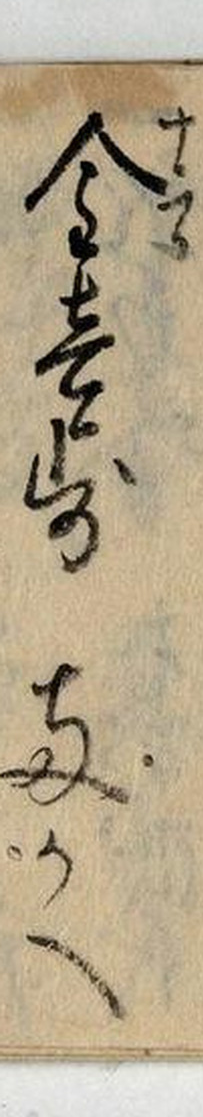金一歩両かへ
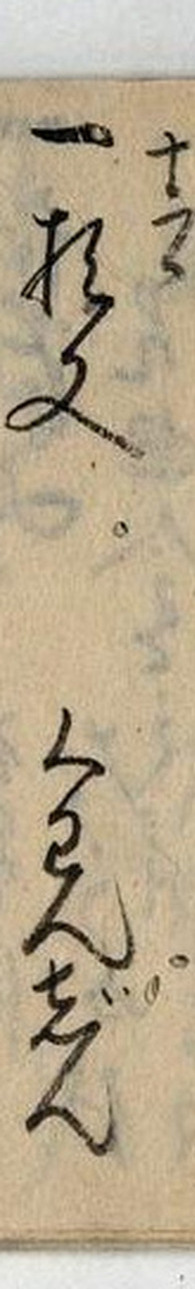一十文くわんじん
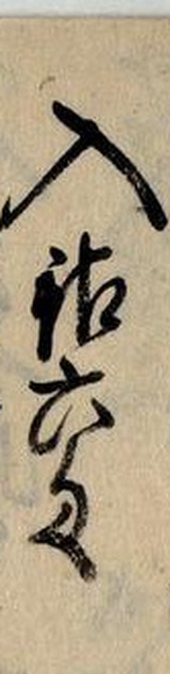入銀六匁
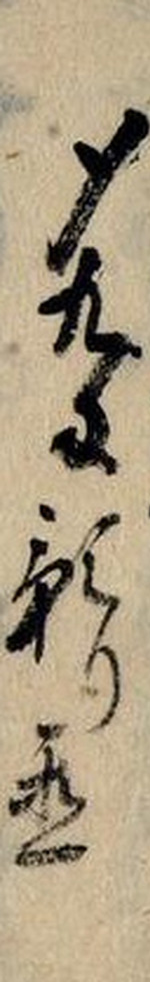〆九匁預り置

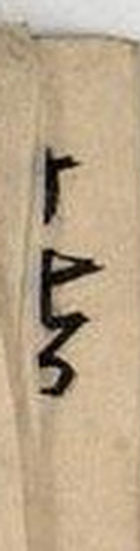十七日
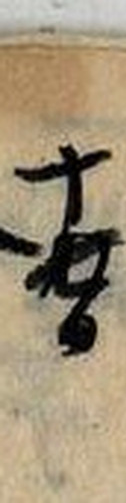十六日
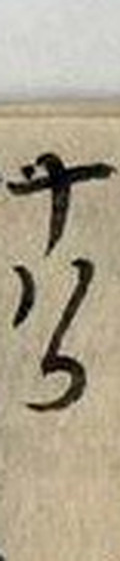十六日

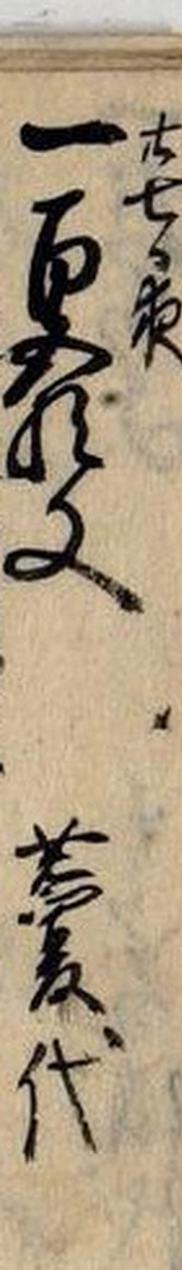一百五拾文蕎麦代
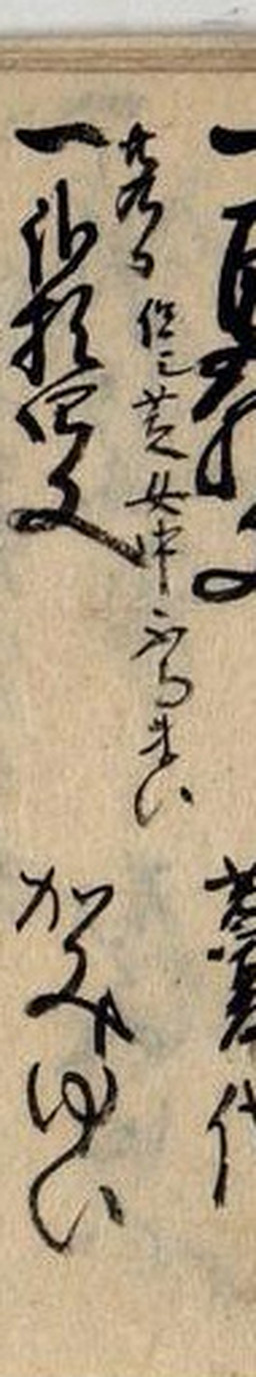一弐拾四文かみゆい
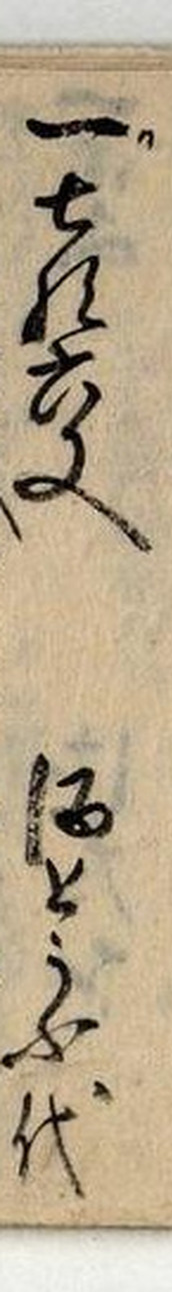一七拾六文酒とうふ代
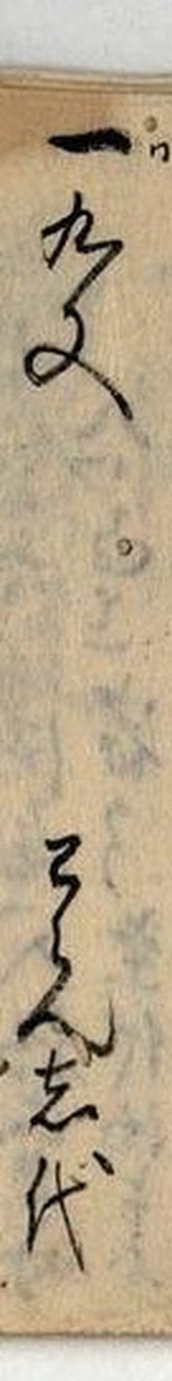一九文わらし代
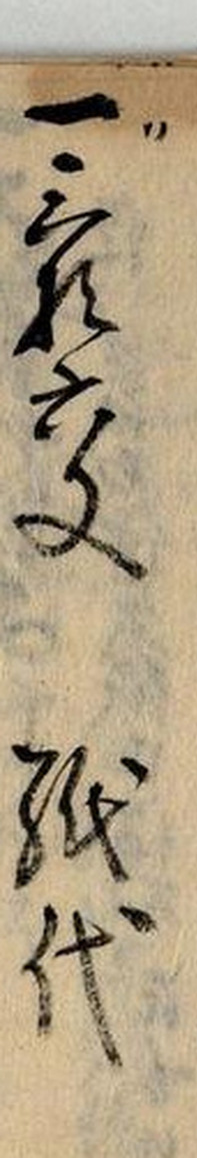一三拾六文紙代
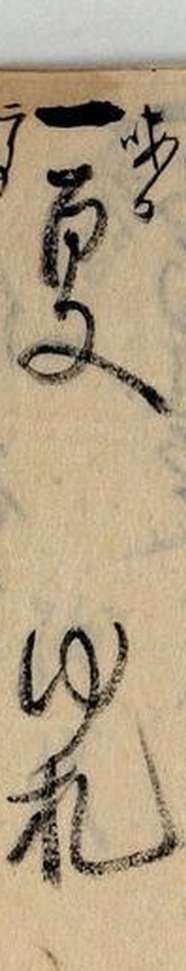一百文ゆ札
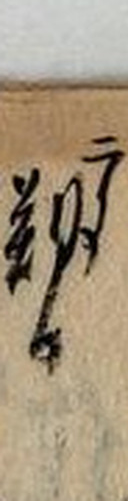二月朔日
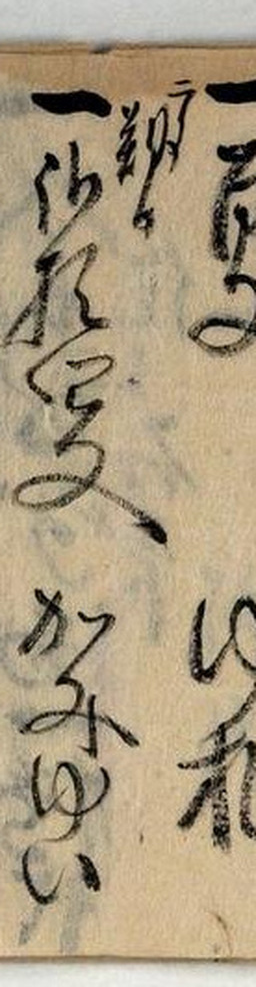一弐拾四文かみゆい
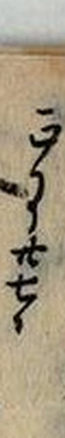正月廿七日
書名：道中小遣留帳（旅）
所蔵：福井県文書館 Fukui Prefectural Archives
